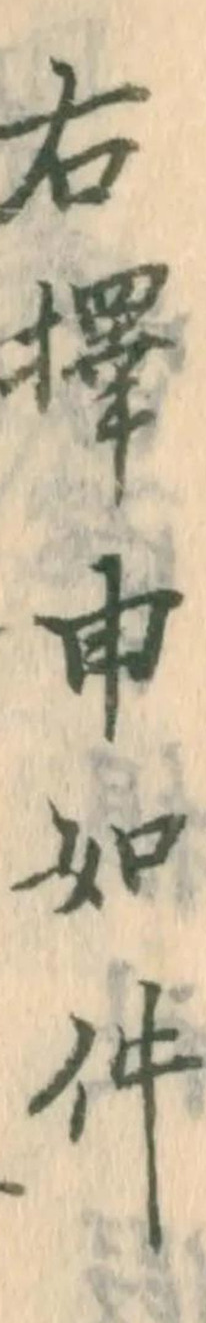右択申如件
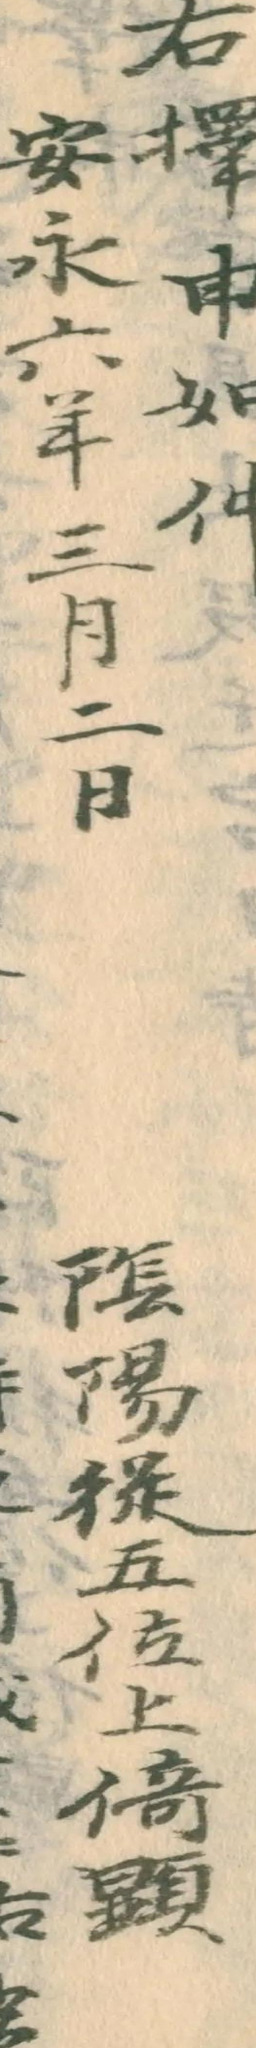安永六年三月二日陰陽従五位上倚顕
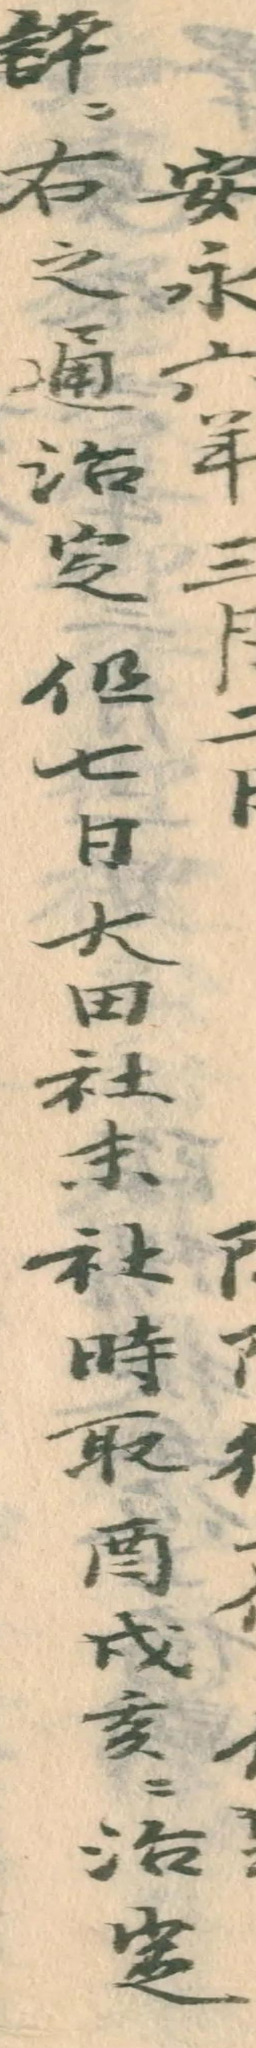評ニ右之通治定但七日大田社末社時取酉戌亥ニ治定
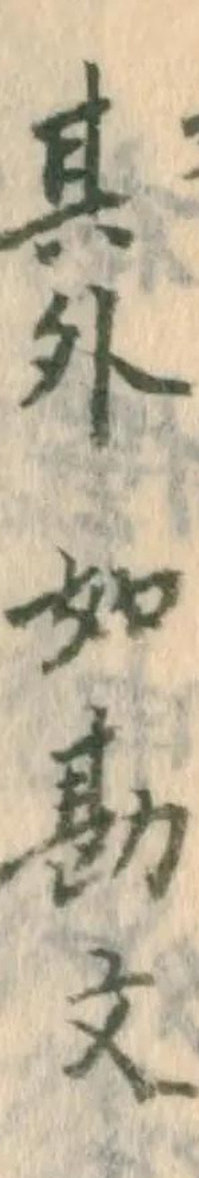其外如勘文
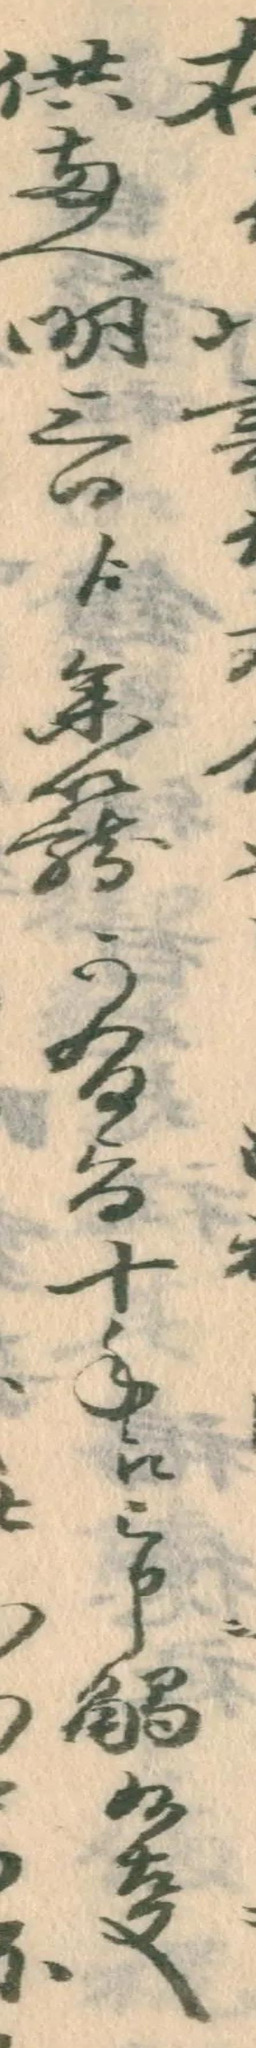供両人明三日ゟ参籠可有旨十手江被申触候事
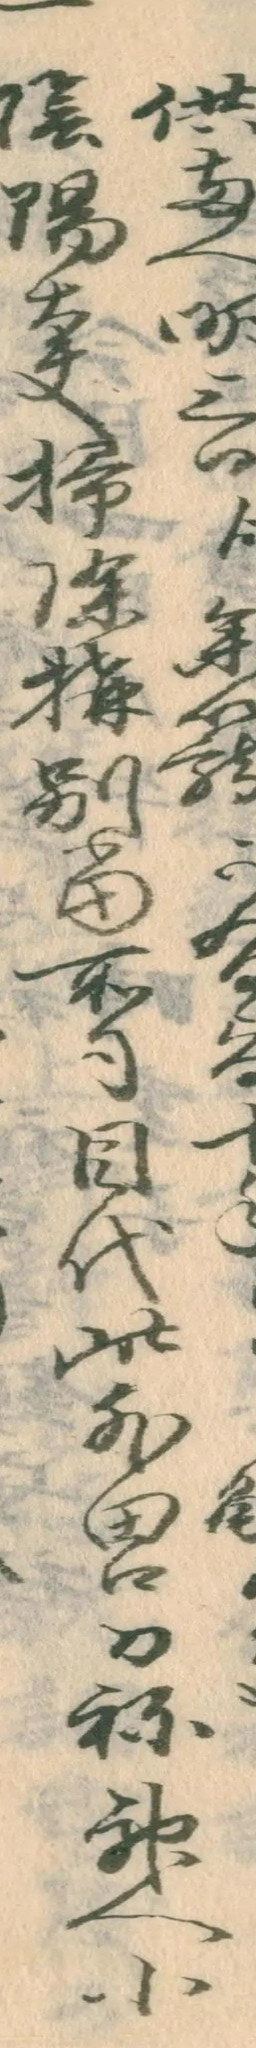一陰陽大夫掃除構別当所司目代此外田口刀祢神人小
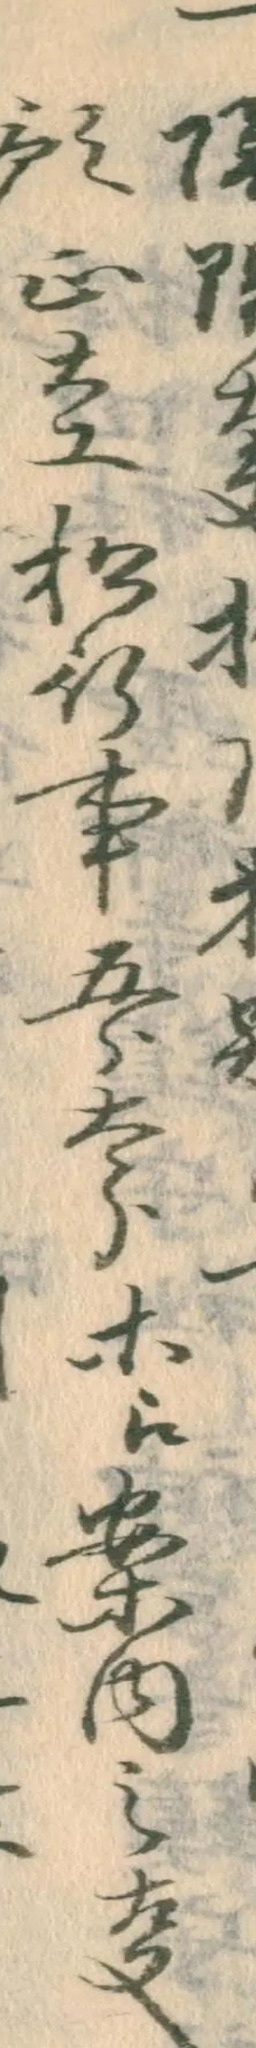預正大工松行事五郎太郎等江案内之事
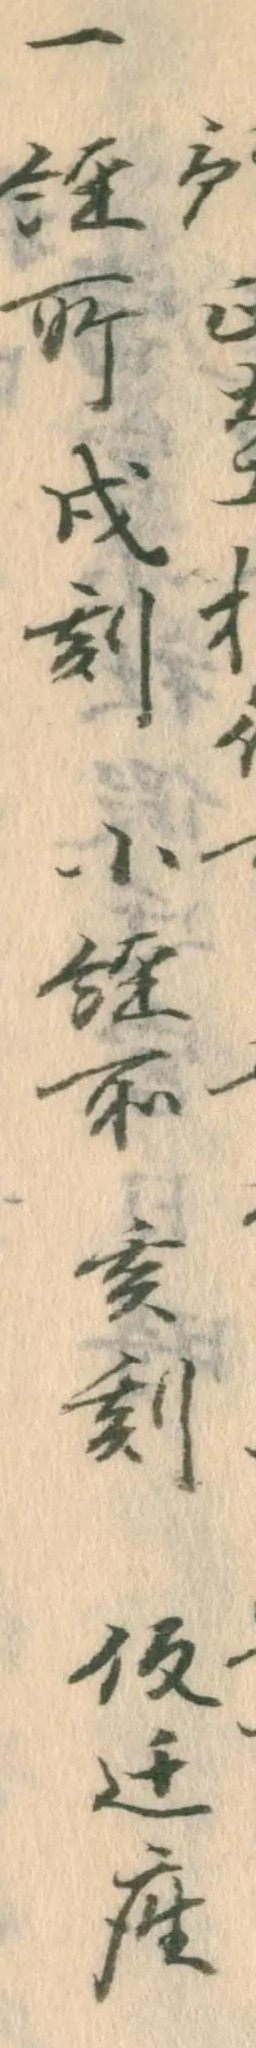一経所戌刻小経所亥刻仮迁座
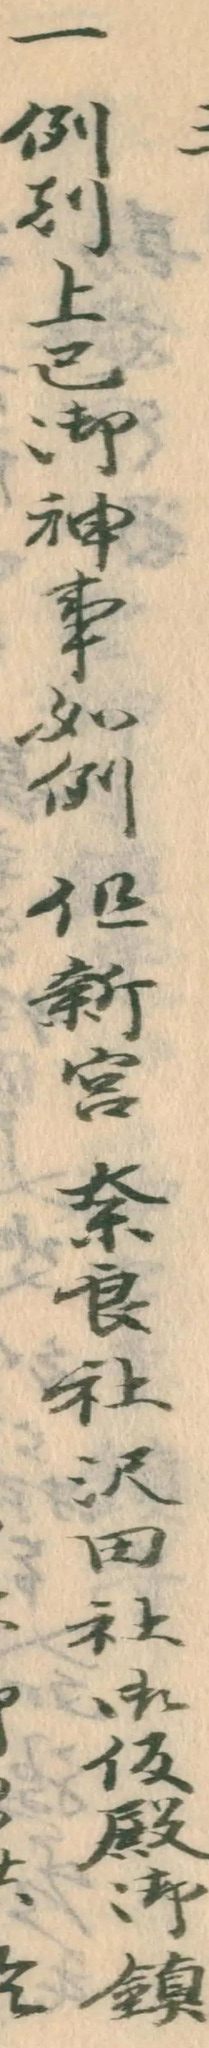一例刻上巳御神事如例但新宮奈良社沢田社御仮殿御鎮
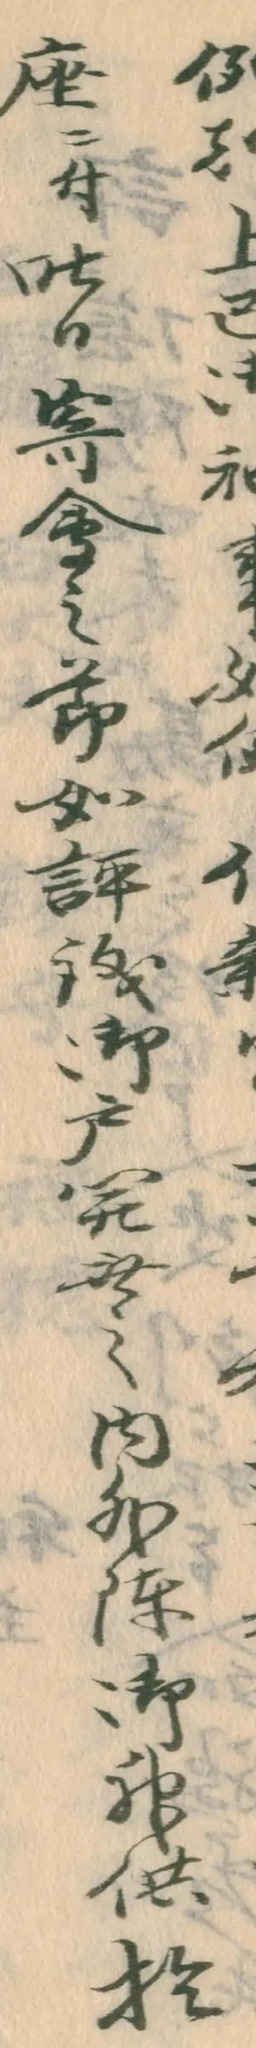座ニ付昨日寄会之節如評議御戸開無之内外陣御神供於
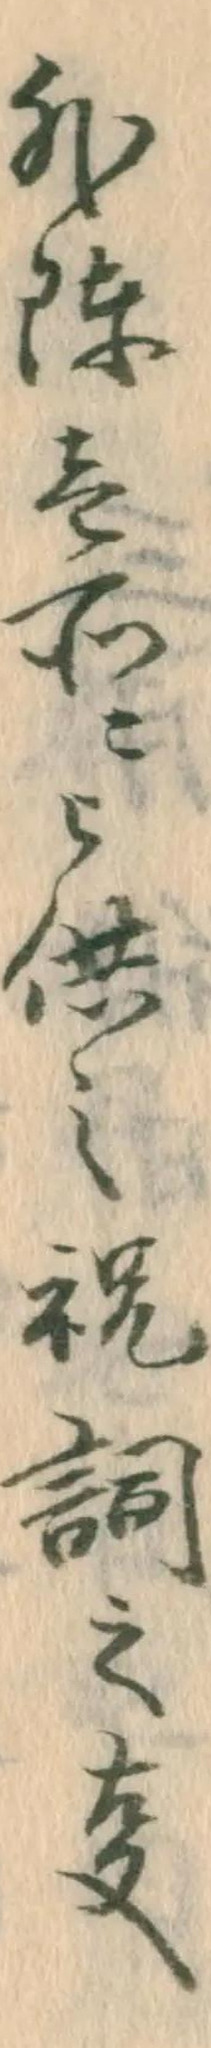外陣壱所ニ被供之祝詞之事
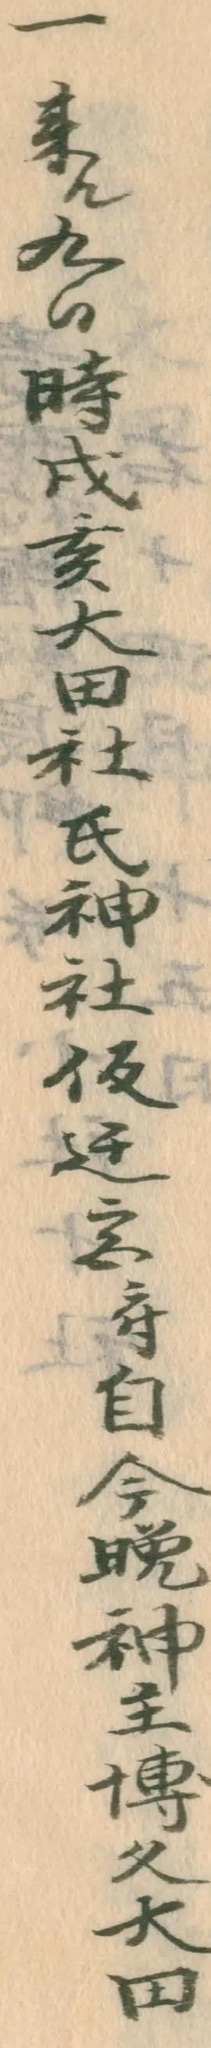一来ル九日時戌亥大田社氏神社仮迁宮ニ付自今晩神主博久大田
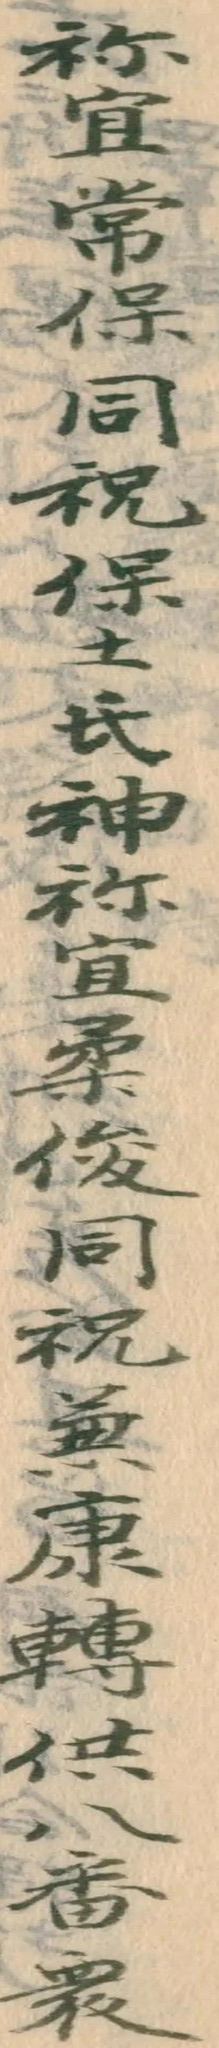祢宜常保同祝保土氏神祢宜柔俊同祝兼康転供八番衆
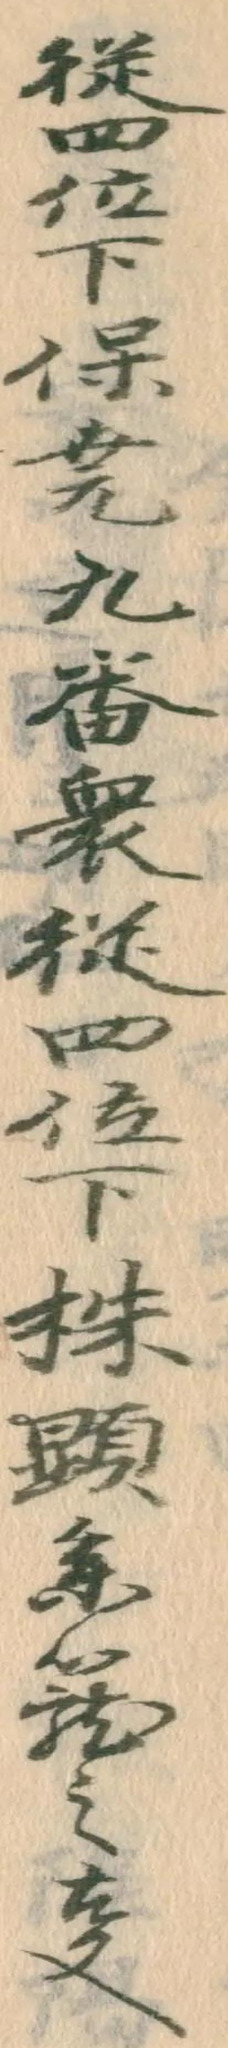従四位下保尭九番衆従四位下株顕参籠之事
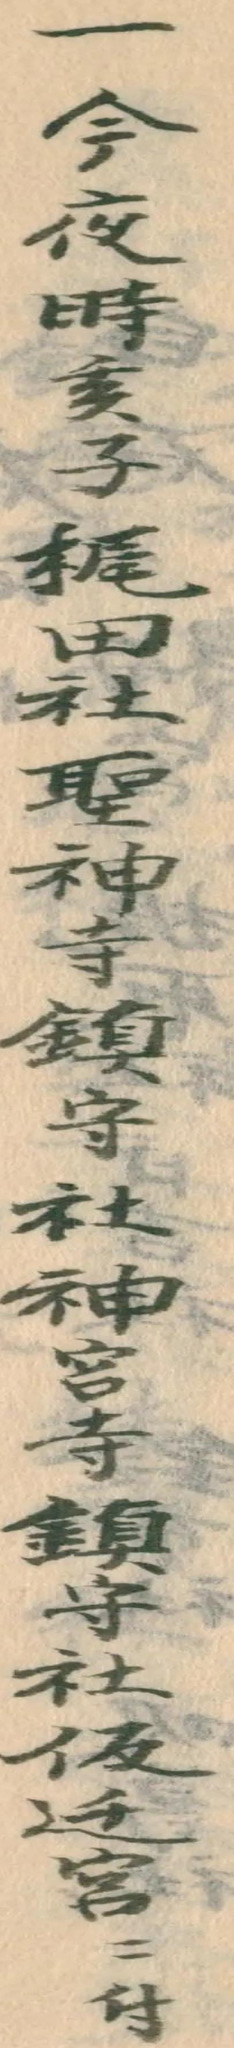一今夜時亥子梶田社聖神寺鎮守社神宮寺鎮守社仮迁宮ニ付
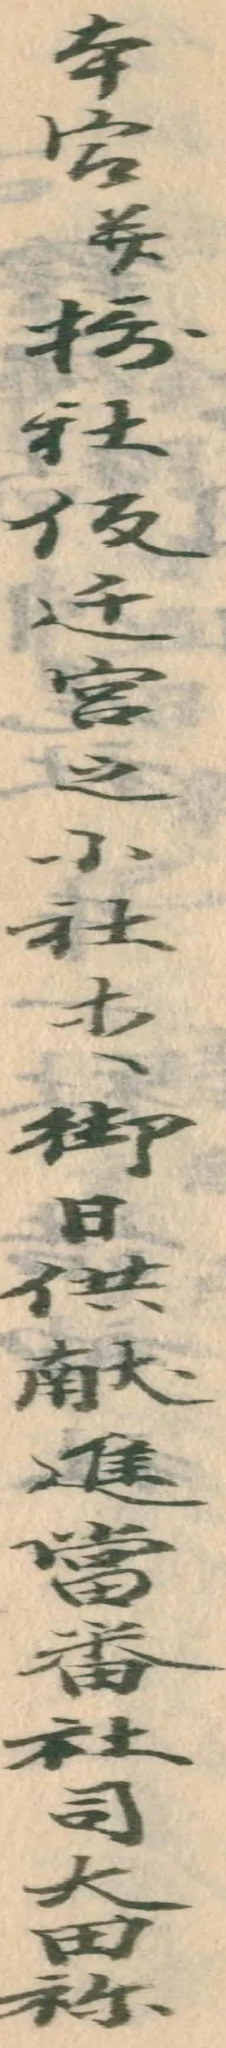本宮并摂社仮迁宮之小社等へ御日供献進当番社司大田祢
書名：賀茂社記録. 第17冊
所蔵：国立国会図書館 National Diet Library, JAPAN
